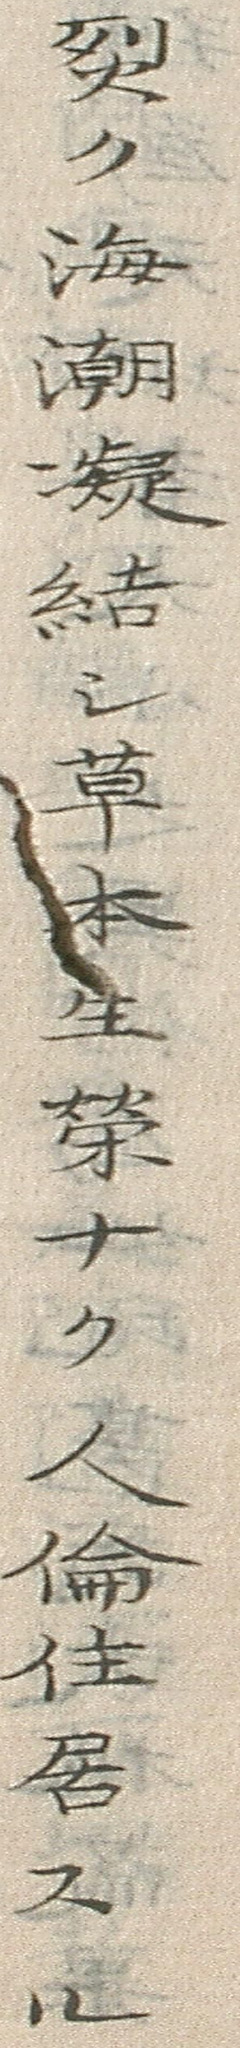烈ク海潮凝結シ草木生栄ナク人倫住居スル
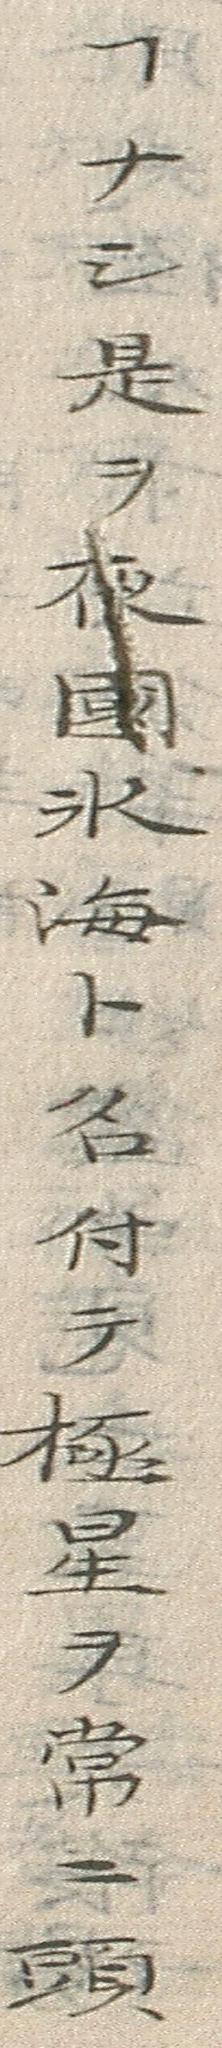コトナシ是ヲ夜国氷海ト名付テ極星ヲ常ニ頭
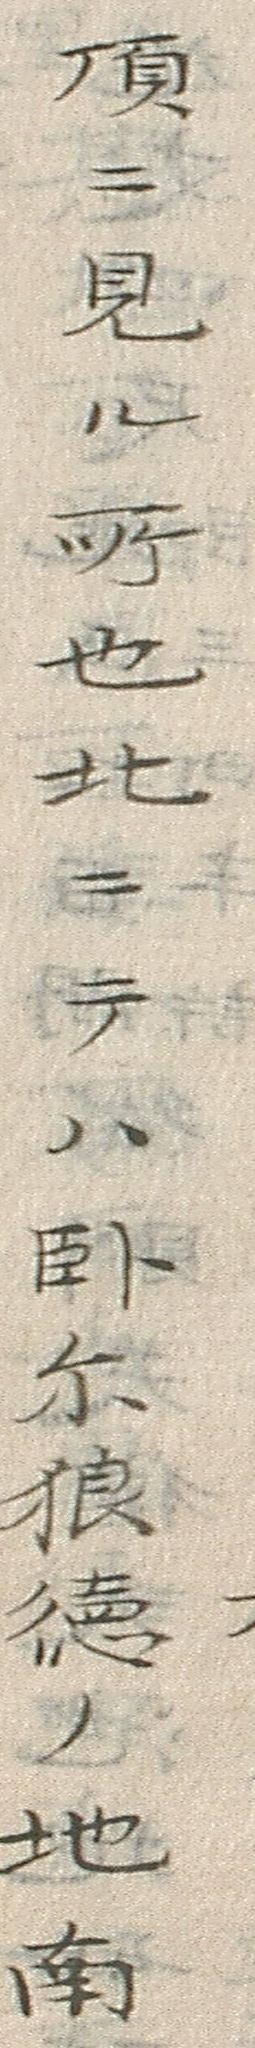頂ニ見ル所也北ニテハ臥尓狼徳ノ地南
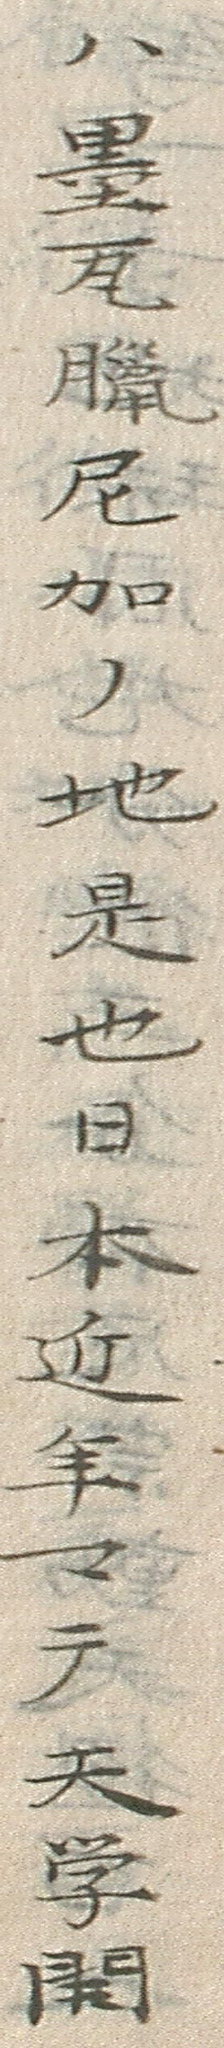ハ墨瓦蠟泥加ノ地是也日本近年マテ天学開
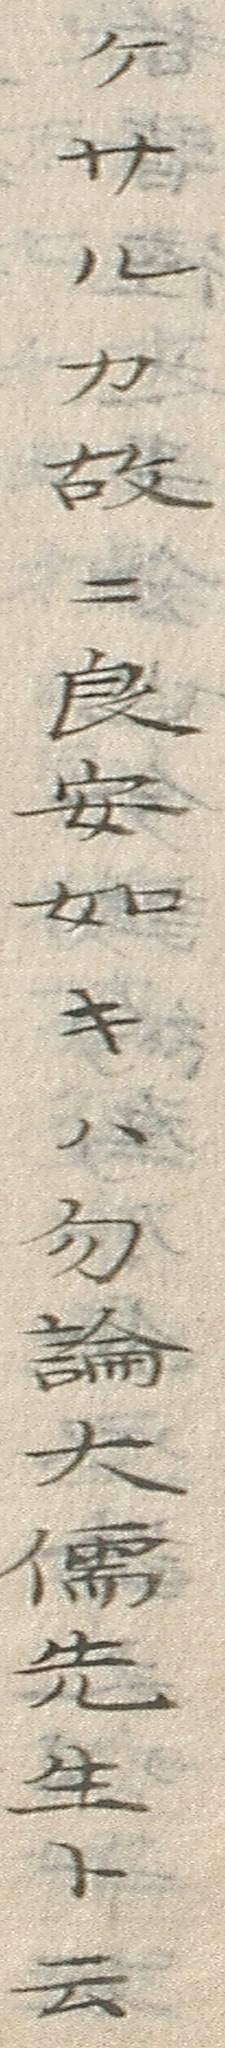ケサルカ故ニ良安如キハ勿論大儒先生ト云
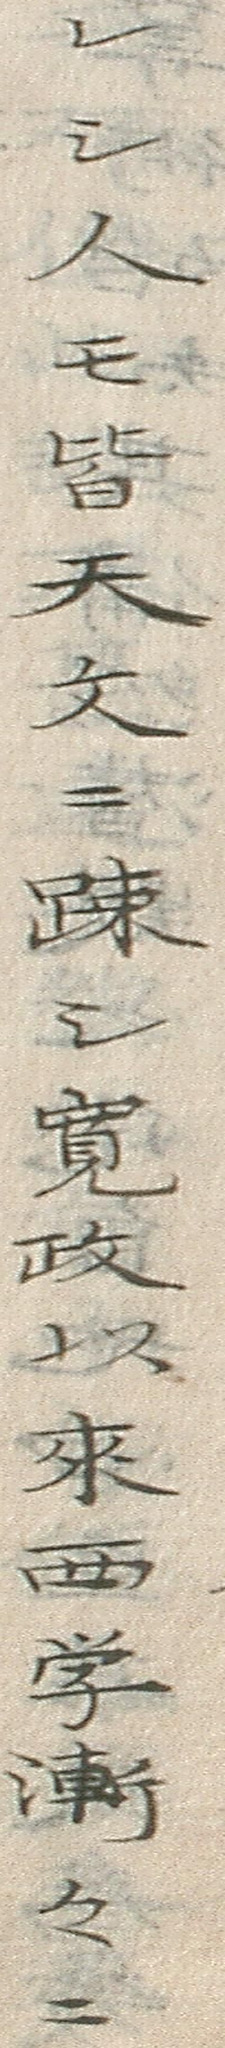レシ人モ皆天文ニ疎シ寛政以来西学漸々ニ
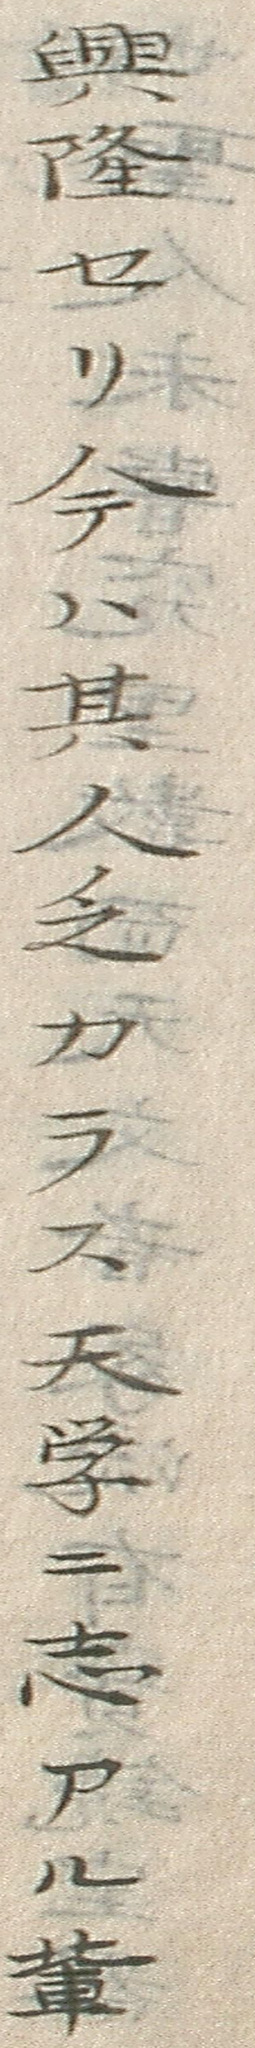興隆セリ今ハ其人乏カラス天学ニ志アル輩
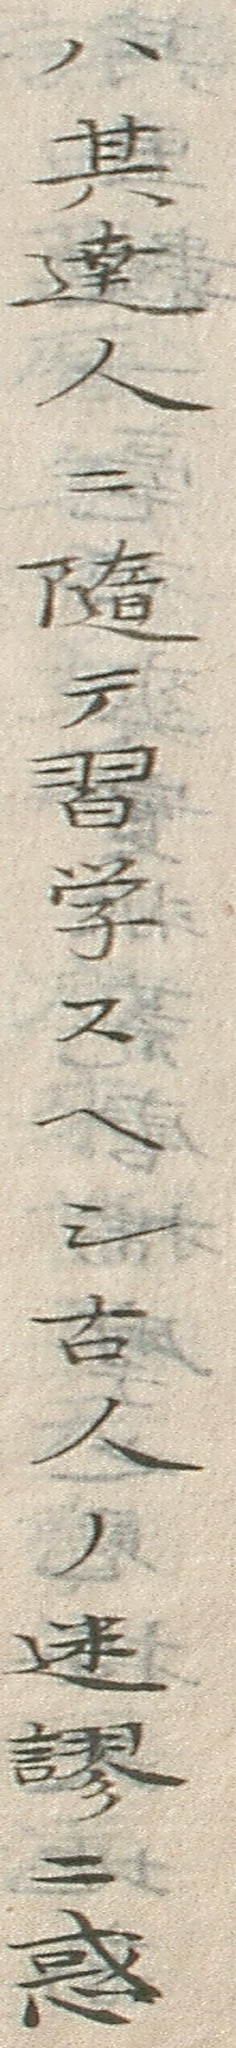ハ其人ニ随テ習学スヘシ古人ノ迷謬ニ惑
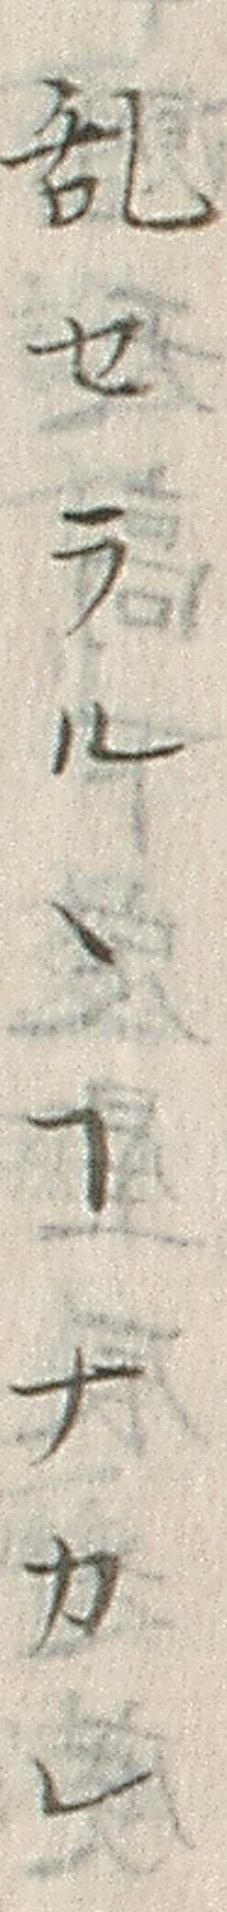乱セラルヽコトナカレ
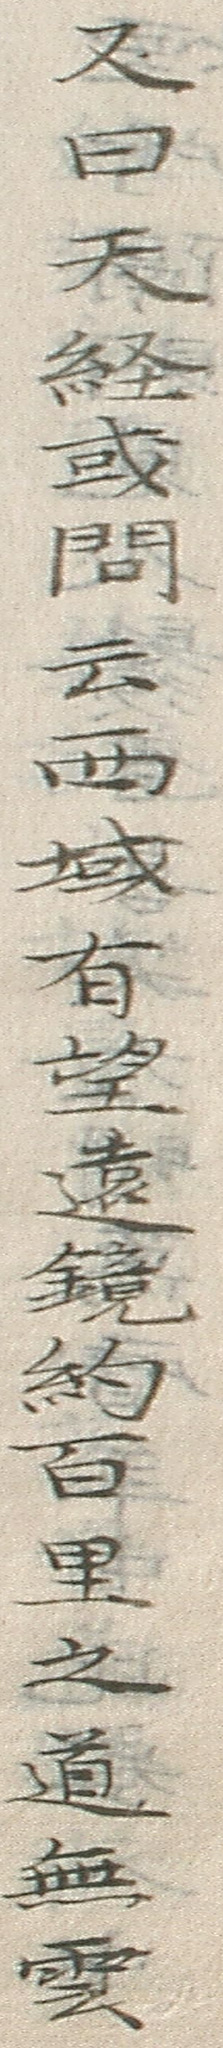又曰天経或問云西域有望遠鏡約百里之道無雲

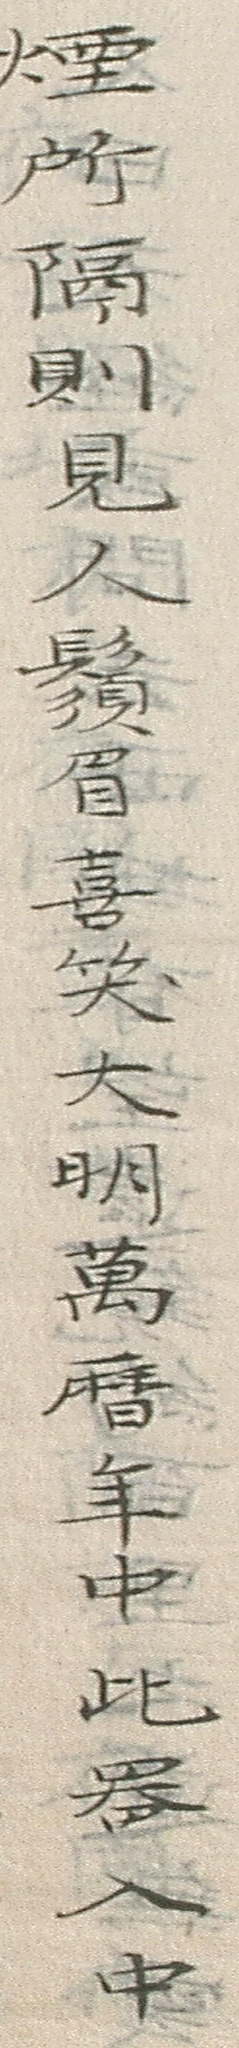煙所隔則見人鬚眉喜笑大明万暦年中此器入中
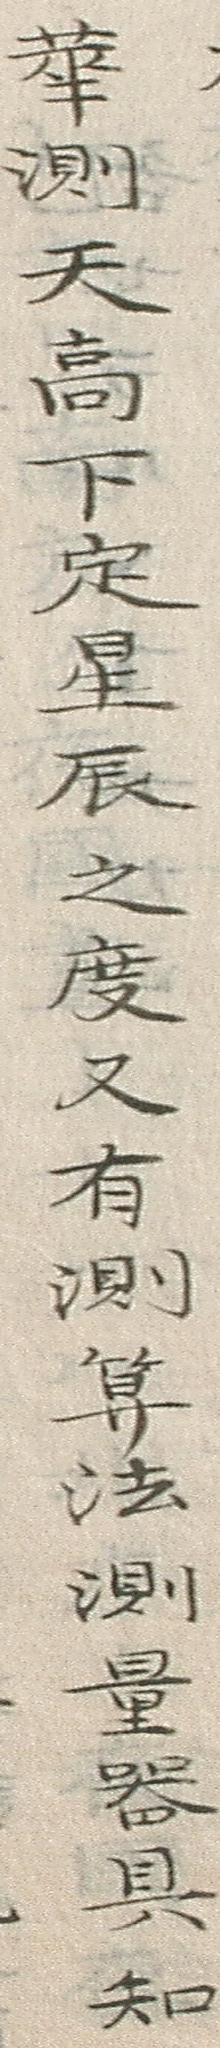華測天高下定星辰之度又有測算法測量器具知
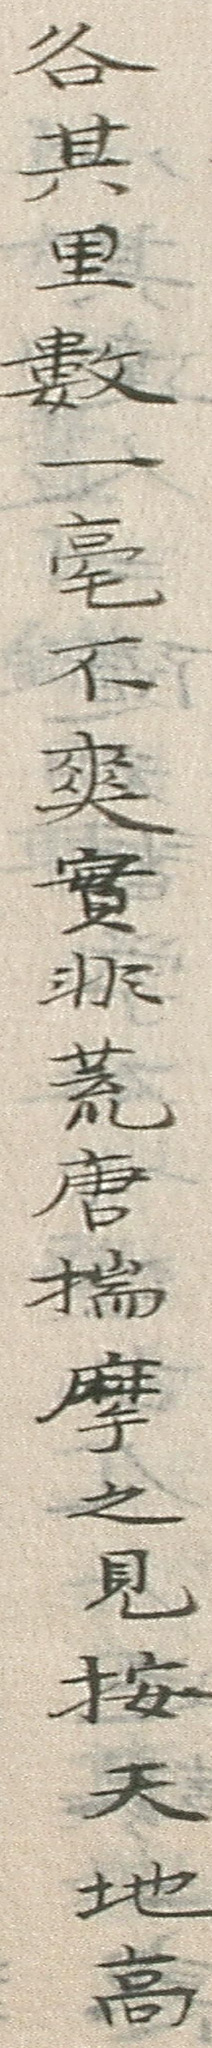各其里数一毫不爽実非荒唐揣摩之見按天地高
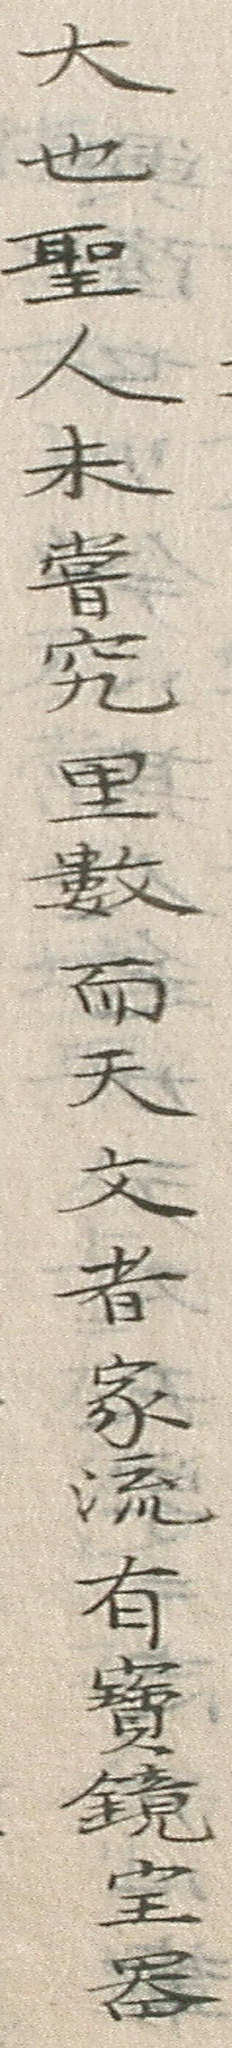大也聖人未嘗究里数而天文者家流有宝鏡宔器
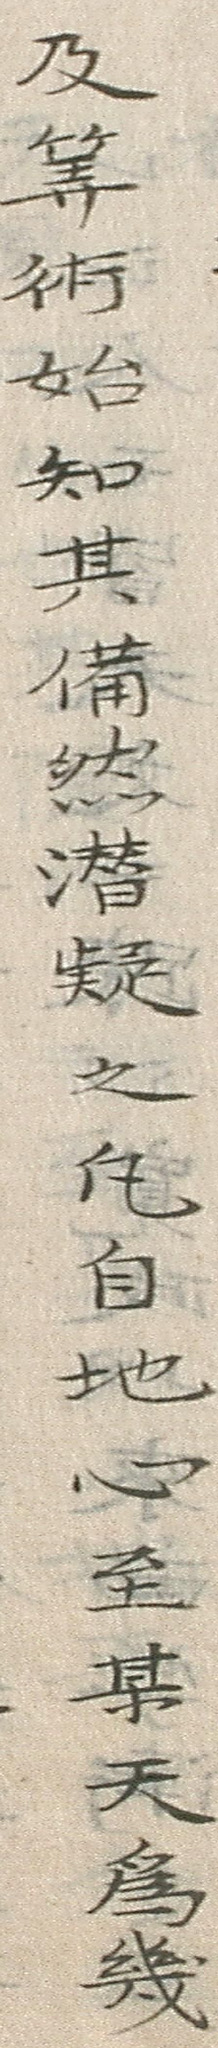及等術始知其備然潜疑之凡自地心至某天為幾
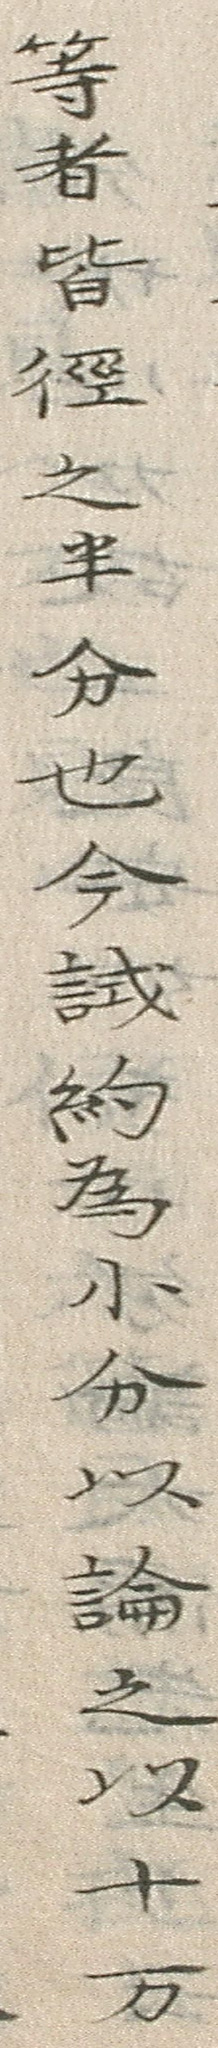等者皆径之半分也今試約為小分以論之以十万
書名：天學略名目羽翼　全
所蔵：東京大学地震研究所図書室 Earthquake Research Institute Library, The University of Tokyo, JAPAN
